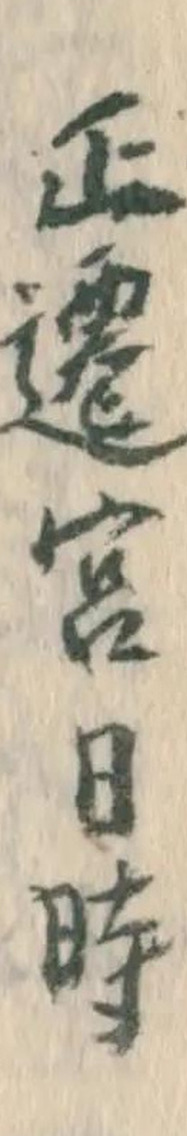正遷宮日時

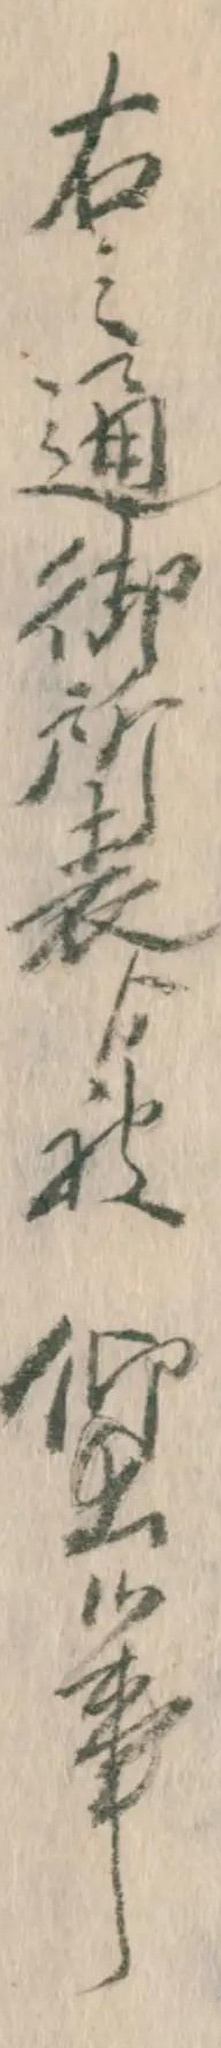右之通御所表ゟ被仰出候事
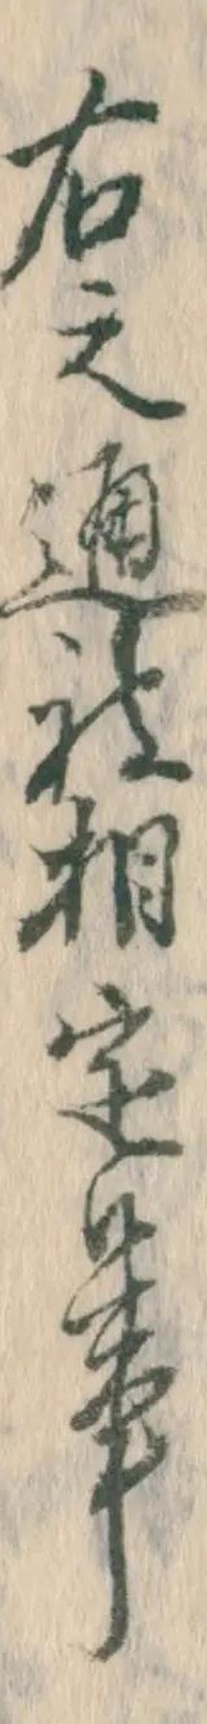右之通被相定候事
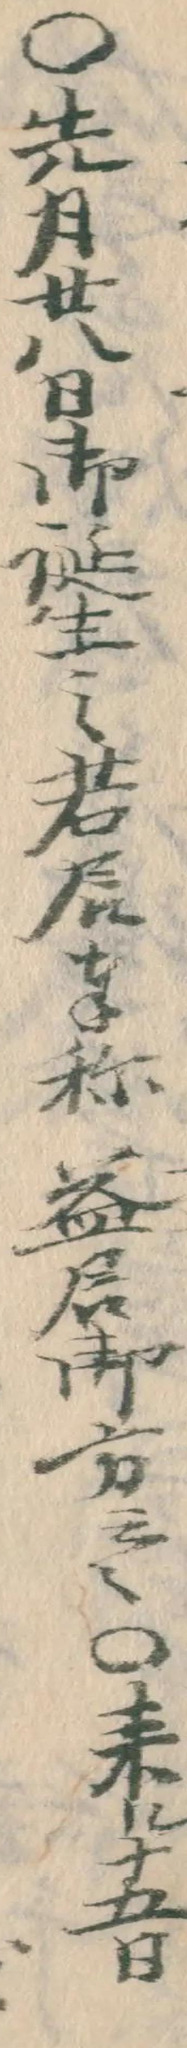○先月廿八日御誕生之若君奉称益君御方云々○来ル十五日
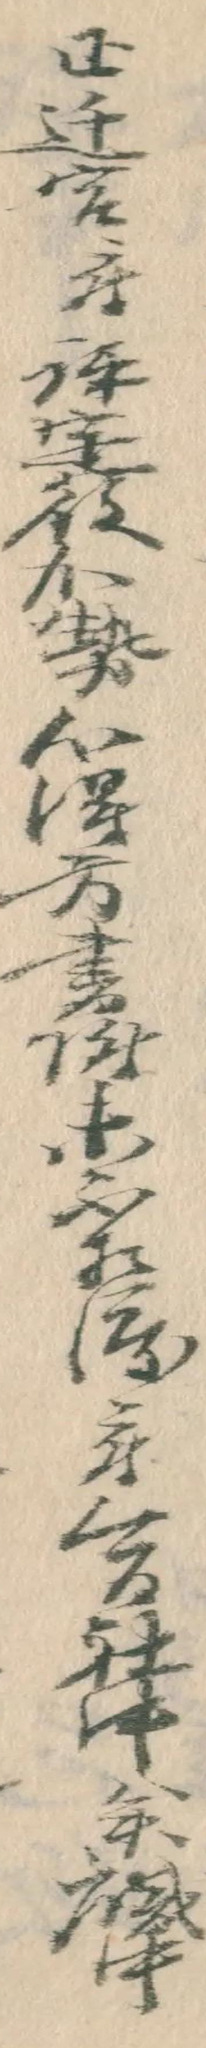正遷宮ニ付評定役加勢心得方書附等不相渡ニ付今日社中参職中
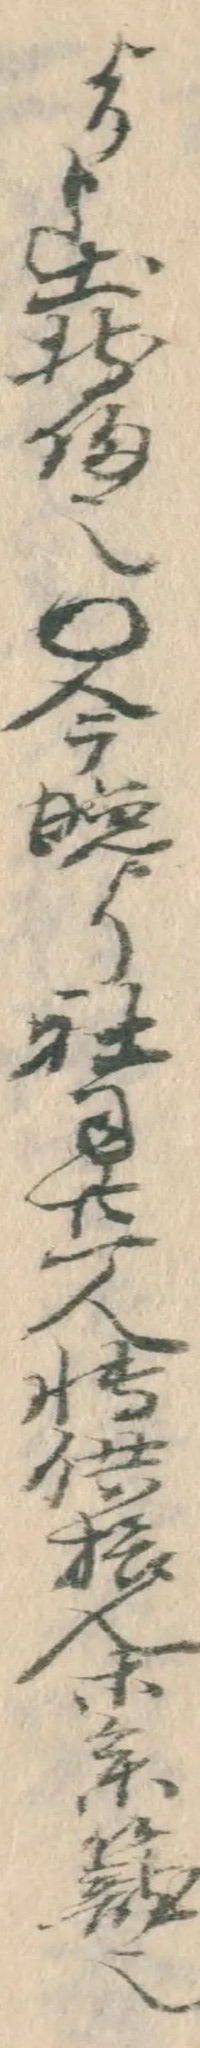より申出持帰也○今晩より社司廿一人轉供拾人等参籠也
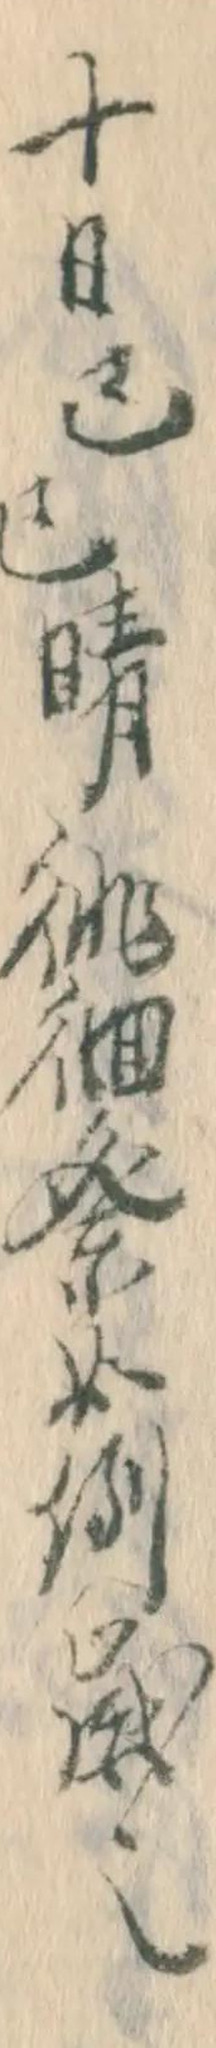十日己巳晴徘徊祭如例歳也
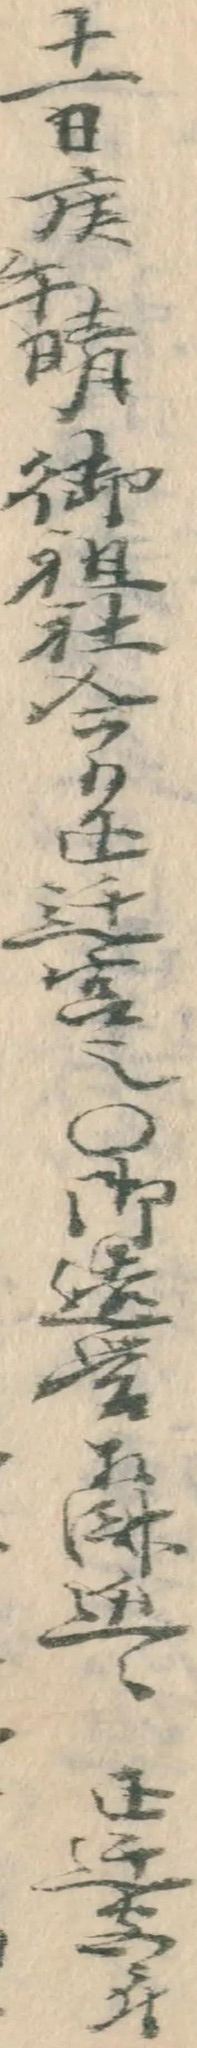十一日庚午晴御祖社今日正遷宮也○御造営相済近々正遷宮ニ付
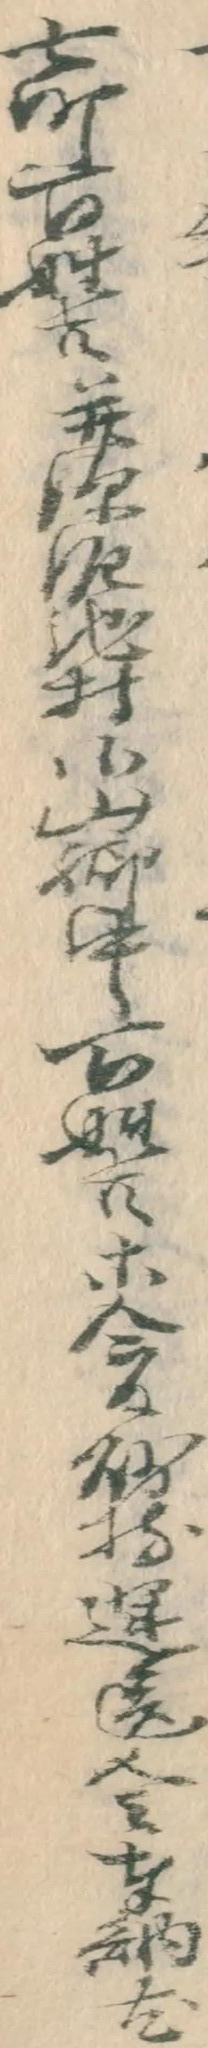七町百姓共并深泥池村小山郷中百姓共等今日砂持運送令奉納尤

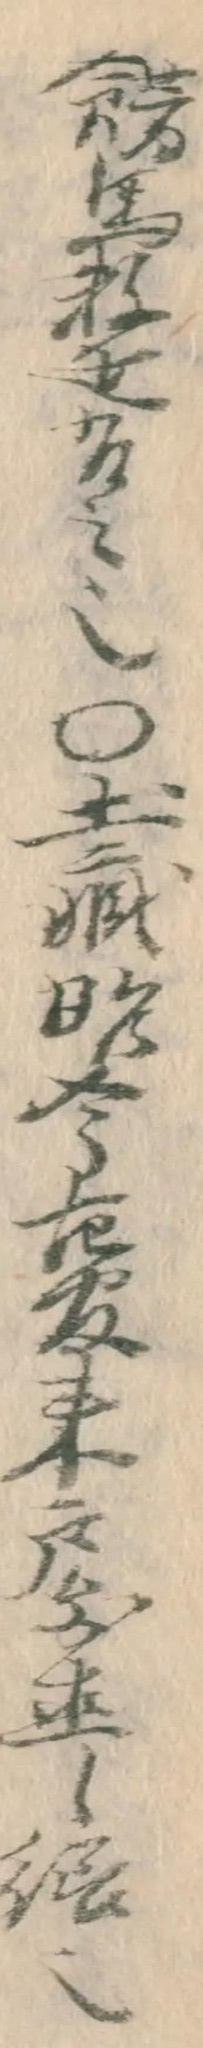餝馬数疋有之〇土蔵昨今左官来戸前直し話也
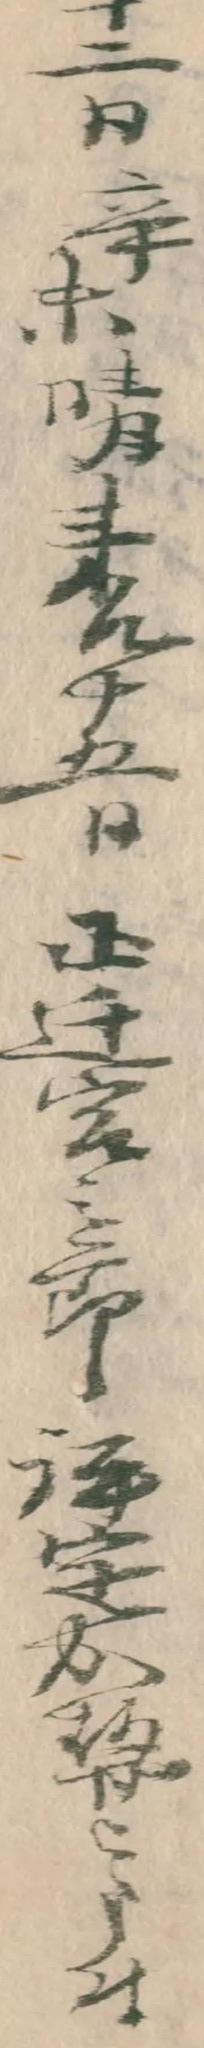十二日辛未晴来ル十五日正遷宮之節評定加勢被申付
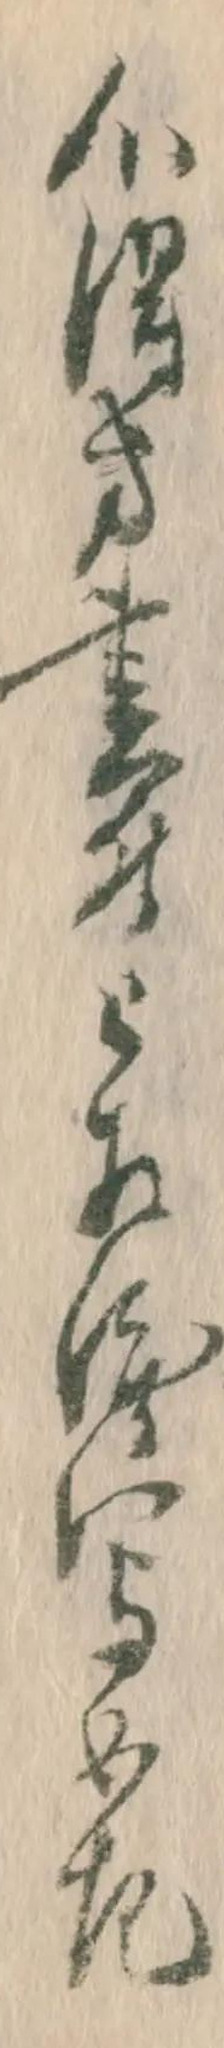心得方書付被相渡写如左
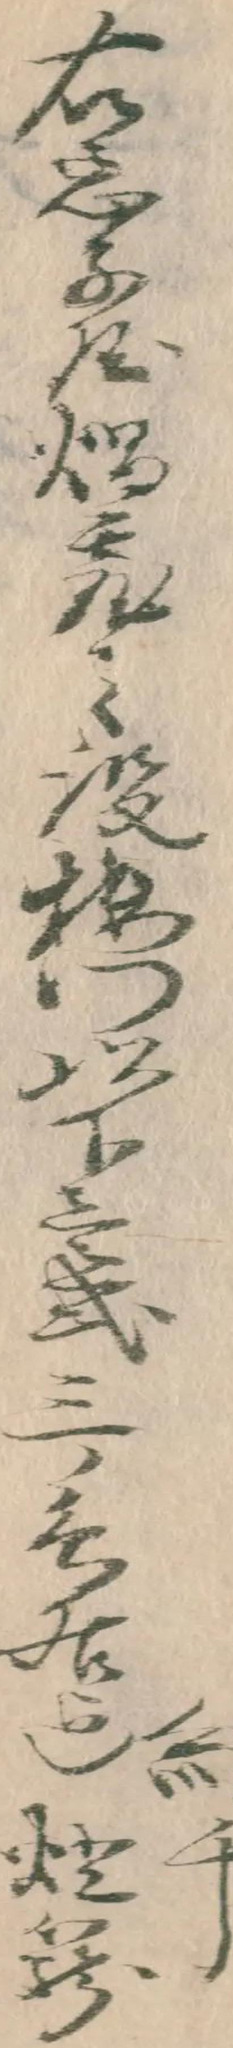右忌子屋燭臺之役楼門以下壱弐三ノ鳥居迄燈籠
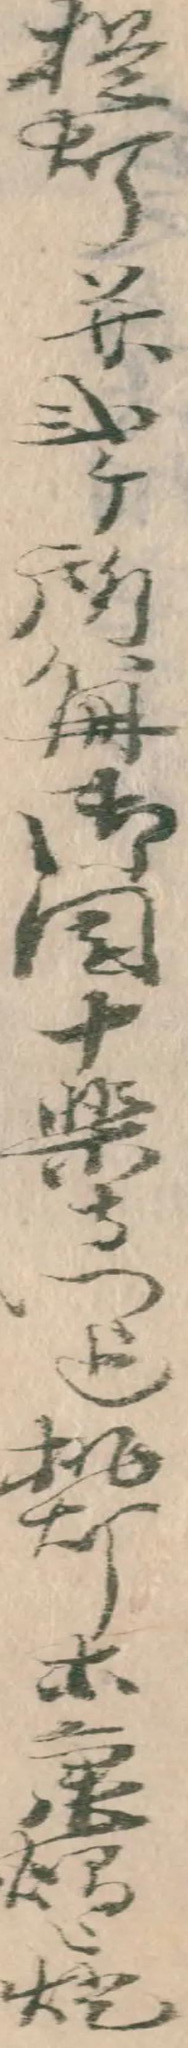提灯幷弐ヶ所笧御圍十楽寺門迄挑灯等秉燭被燈
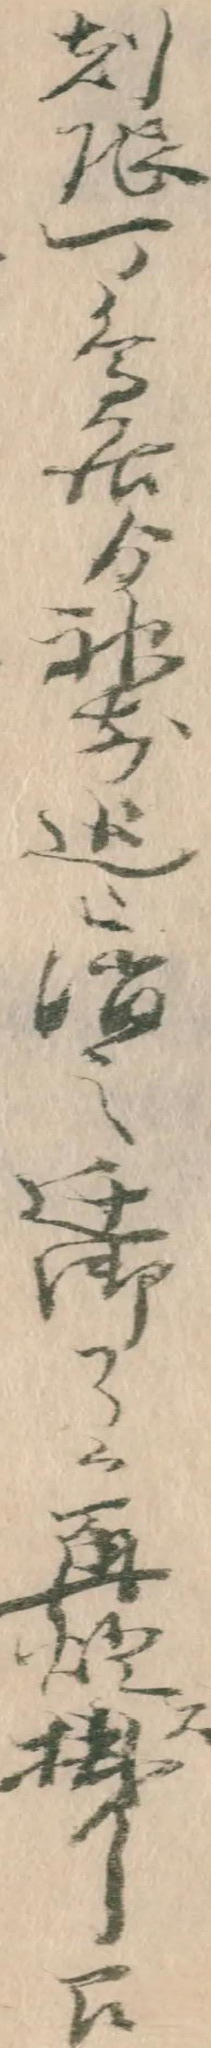刻限一ノ鳥居ゟ神前迄被消之遷御了而再燈ス掛召
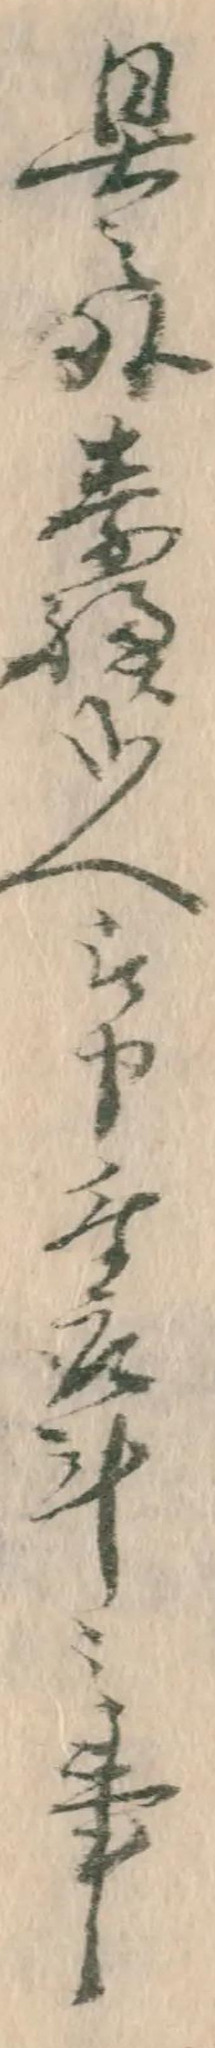具之外素襖弐人被申付取斗之事
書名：賀茂社記録. 第67冊
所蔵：国立国会図書館 National Diet Library, JAPAN
